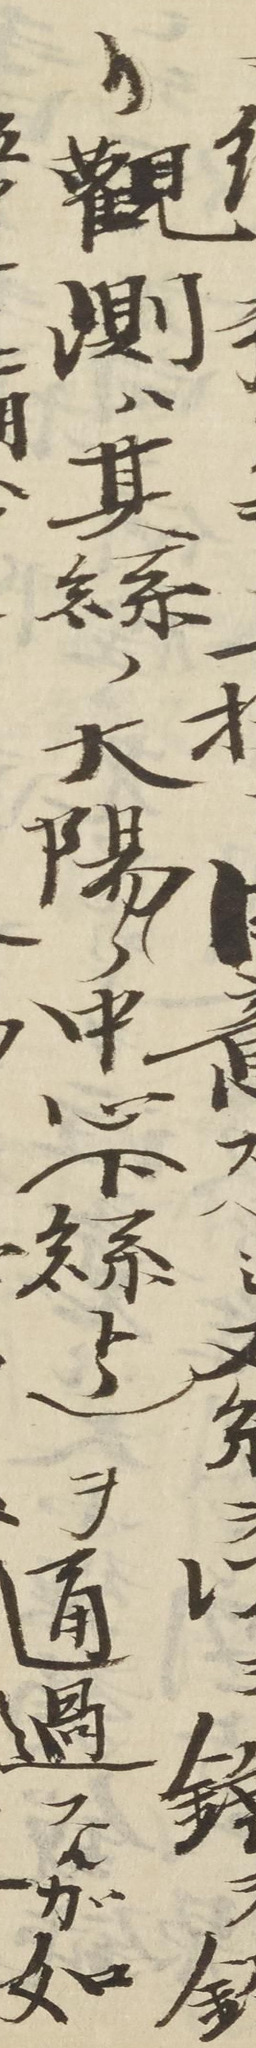リ観測ハ其絲ノ大陽ノ中心ヲ通過スルガ如
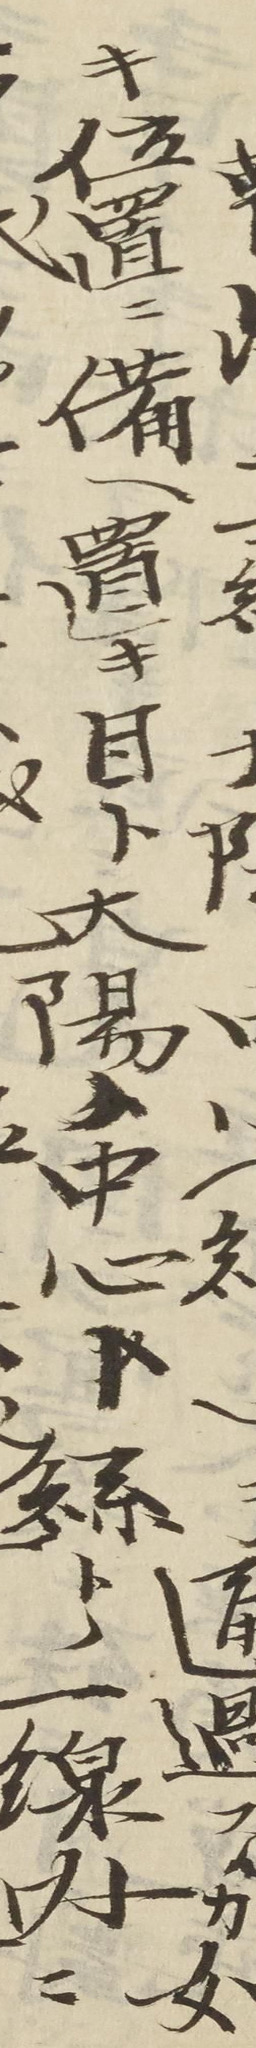キ位置ニ備ヘ置キ目ト大陽ノ中心ト絲トノ一線内ニ
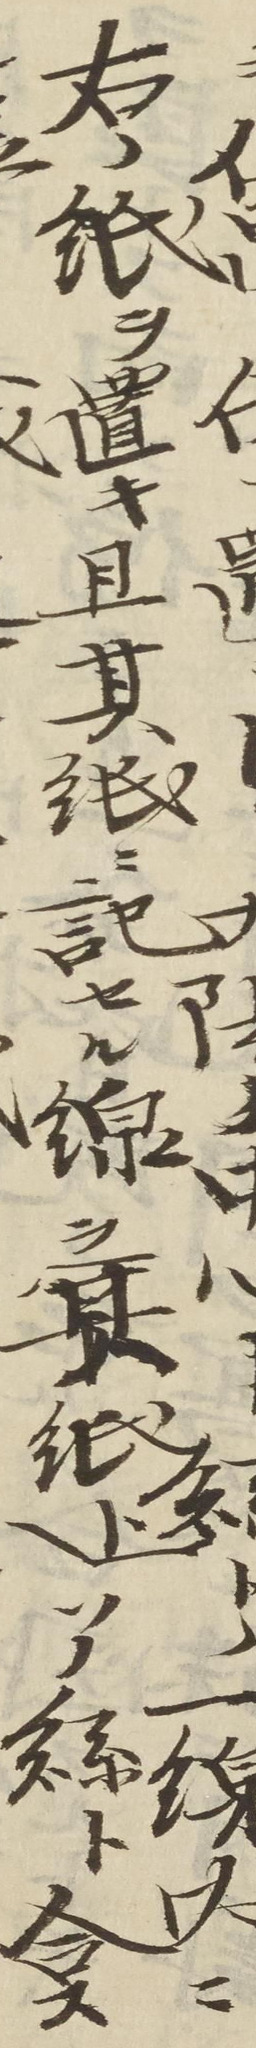右ノ紙ヲ置キ且其紙ニ記セル線ヲソノ絲ト合ス
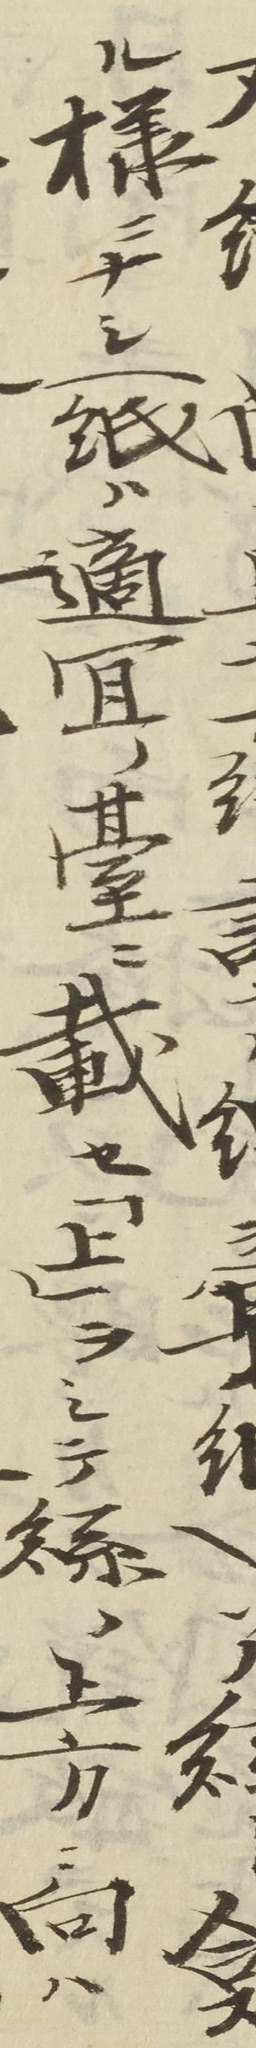ル様ニナシ（紙ハ適宜ノ台ニ載セ「上」ヲシテ絲ノ上方ニ向ハ
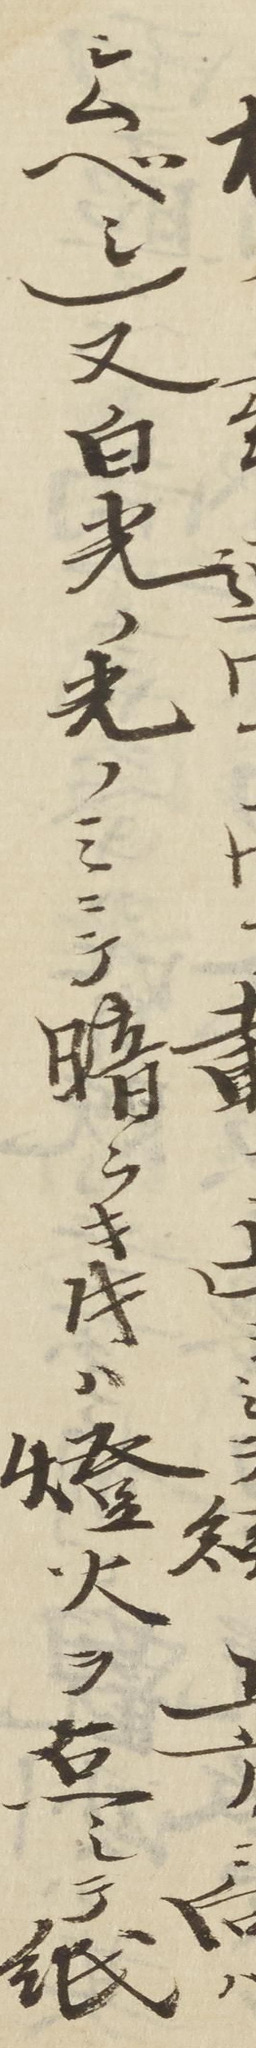シムベシ）又白光ノ光ノミニテ暗ラキトキハ燈火ヲ点シテ紙

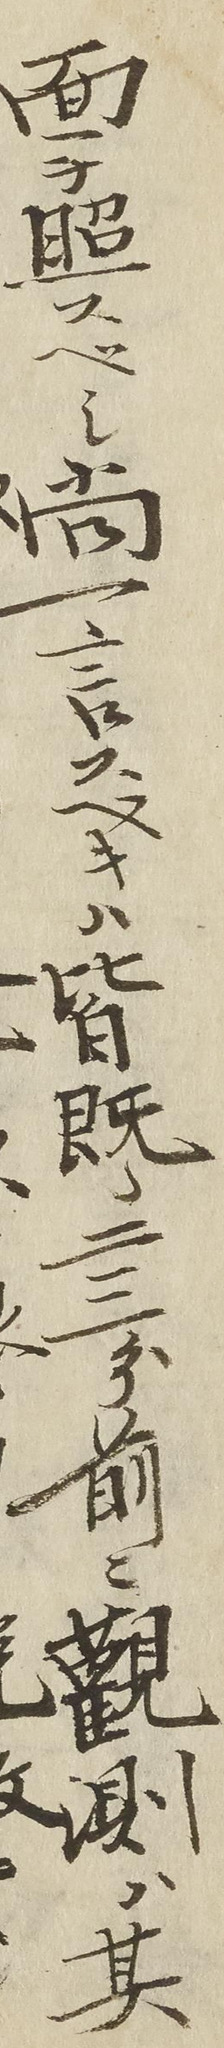面ヲ照スベシ尚一言スベキハ皆既ノ二三分前ニ観測ハ其
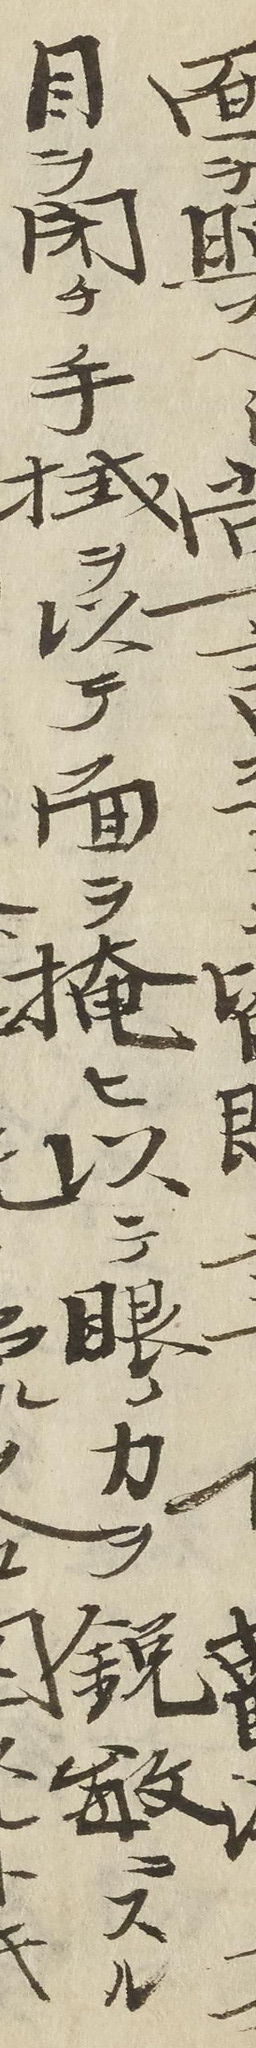目ヲ閉テ手拭ヲ以テ面ヲ掩ヒ以テ眼ノ力ヲ鋭敏ニスル
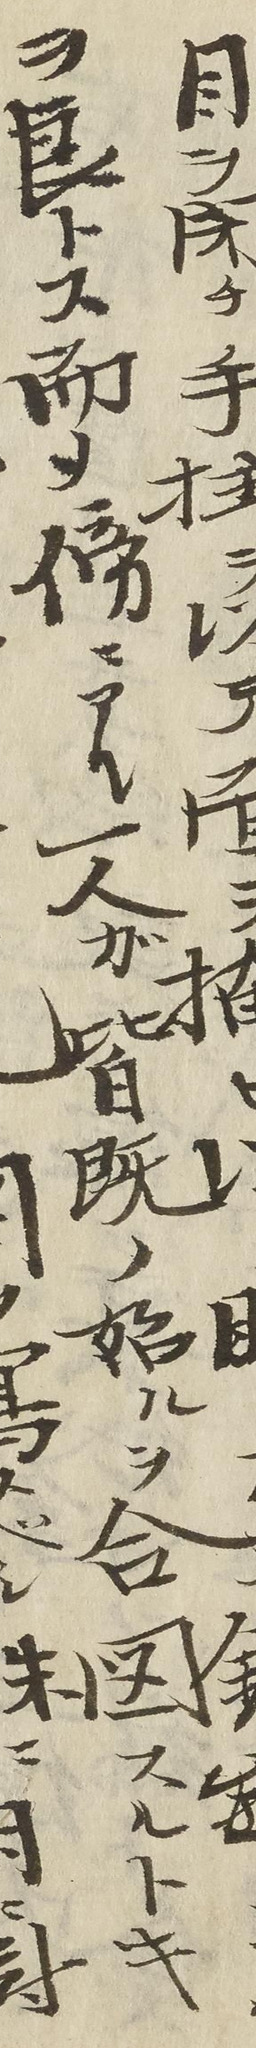ヲ良トス而シテ傍ニアル一人ガ皆既ノ始ルヲ合図スルトキ
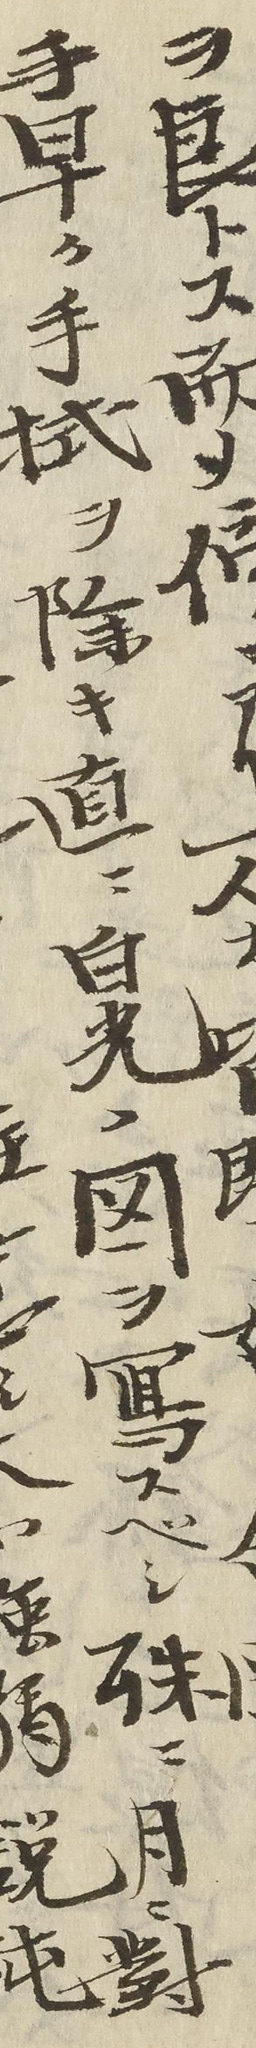手早ク手拭ヲ除キ直ニ白光ヲ写スベシ殊ニ月ニ対
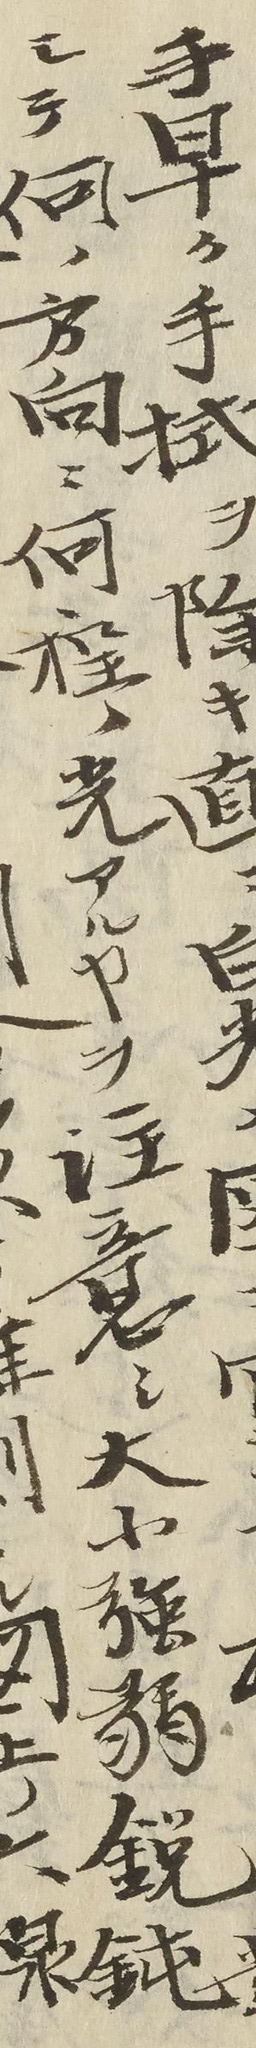シテ何ノ方向ニ何程ノ光アルヤヲ注意シ大小強弱鋭鈍
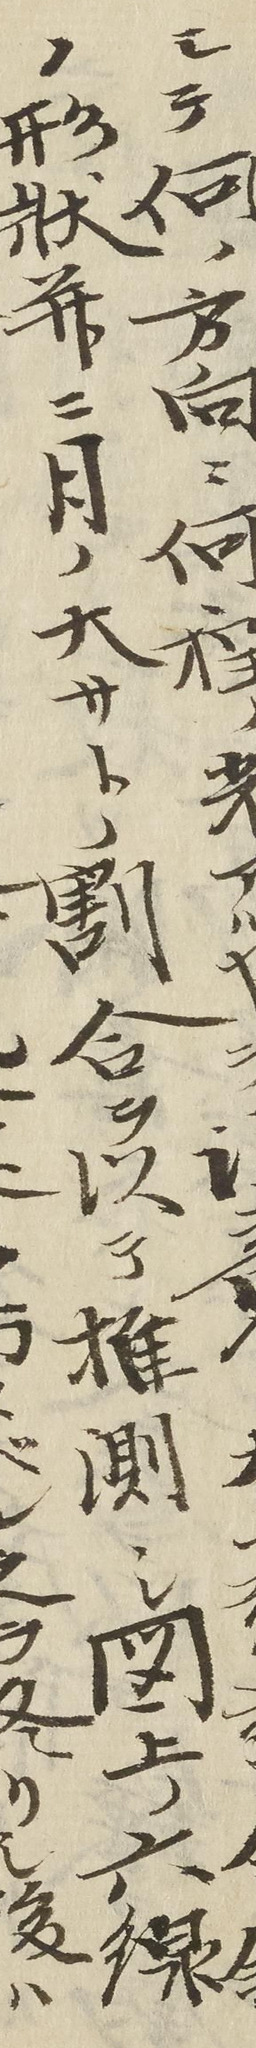ノ形状幷ニ月ノ大サトノ割合ヲ以テ推測シ図上ノ六線
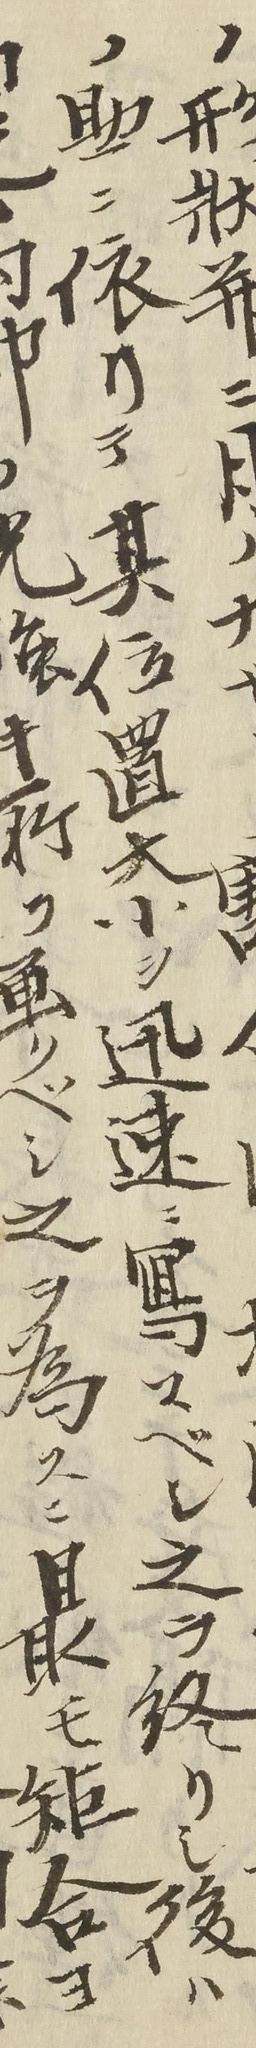ノ助ニ依リテ其位置大小ヲ迅速ニ写スベシ之ヲ終リシ後ハ
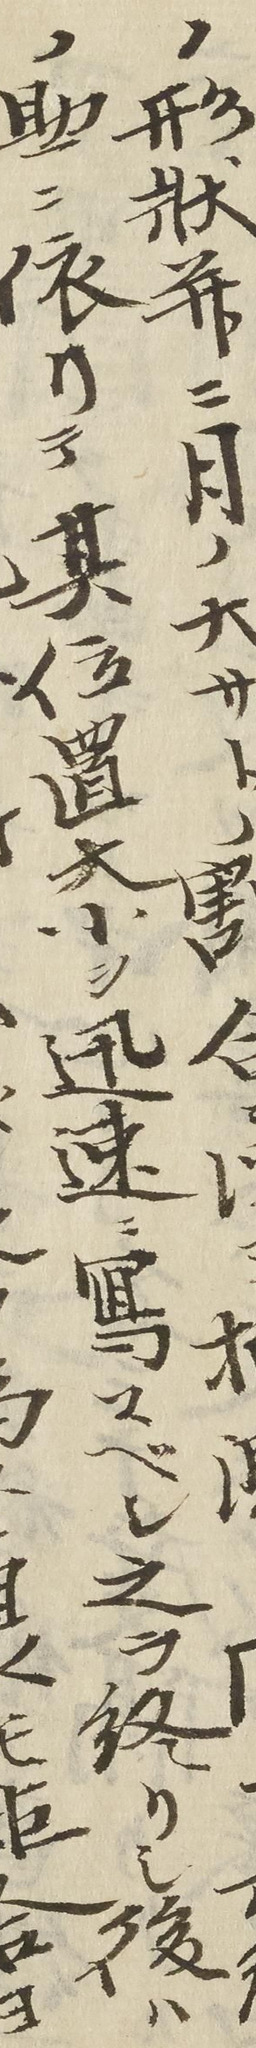ノ助ニ依リテ其位置大小ヲ迅速ニ写スベシ之ヲ終リシ後ハ
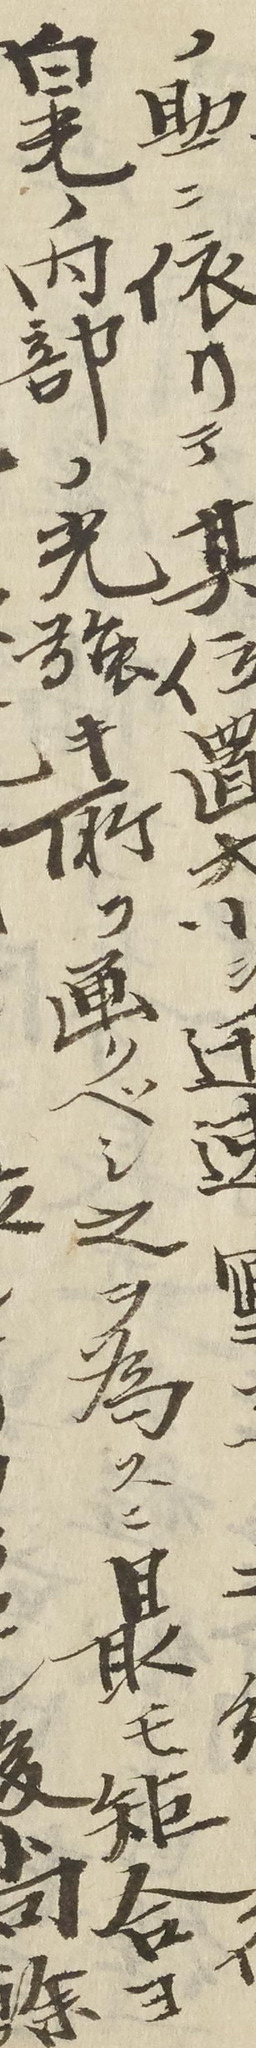白光ノ内部ノ光強キ所ヲ画クベシ之ヲ為スニ最モ矩合ヨ
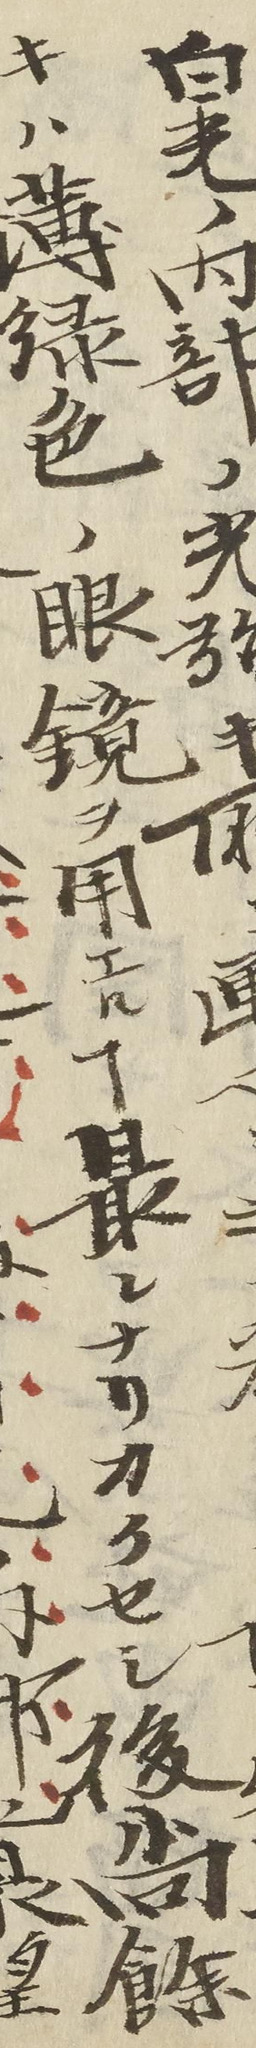キハ薄緑色ノ眼鏡ヲ用エルコト最シナリカクセシ後尚余
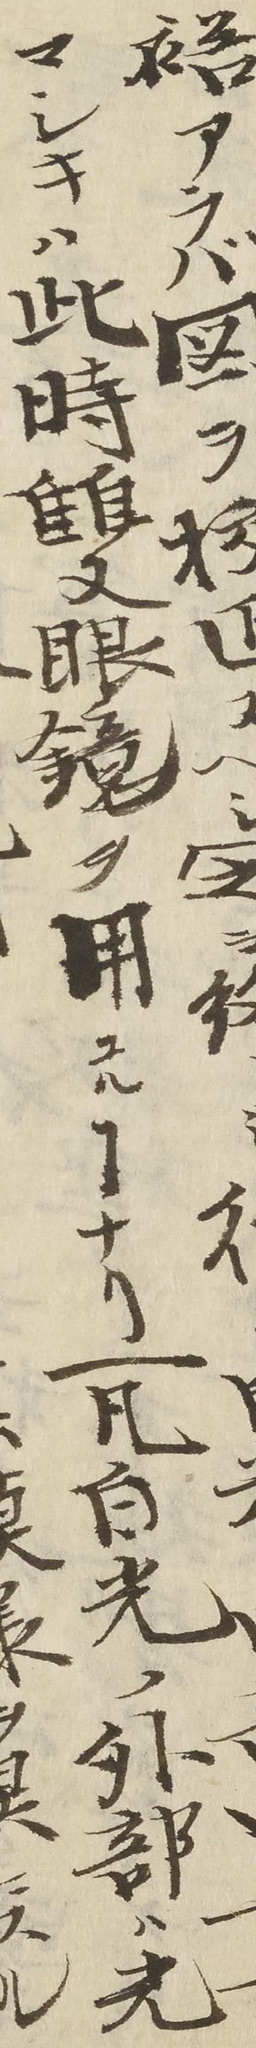マシキハ此時双眼鏡ヲ用ユルコトナリ（凡白光ノ外部ハ光
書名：日蝕録　全
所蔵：東京大学地震研究所図書室 Earthquake Research Institute Library, The University of Tokyo, JAPAN
